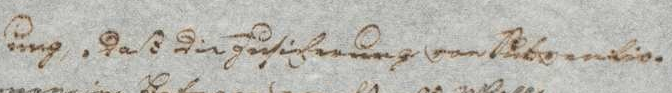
ung, «daß die Zusicherung von Subventio-
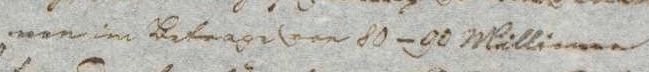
nen in Betrage von 80–90 Millionen
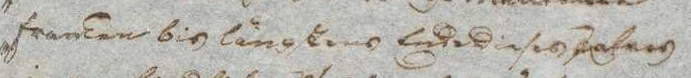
Franken bis längstens Ende dieses Jahres
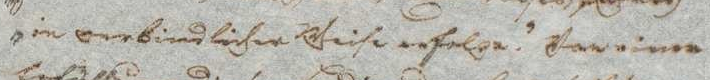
in verbindlicher Weise erfolge.» Von einer
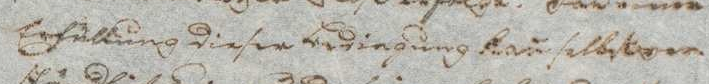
Erfüllung dieser Bedingung kann selbstver-
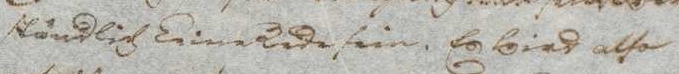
ständlich keine Rede sein. Es wird also
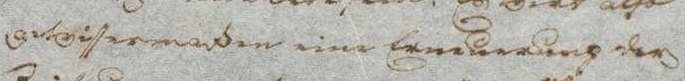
gewissermaßen eine Erneuerung der
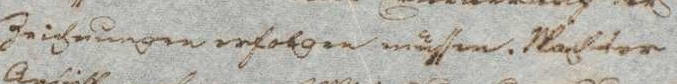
Zeichnungen erfolgen müssen. Nach der
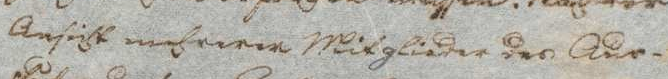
Ansicht mehrerer Mitlieder des Aus-
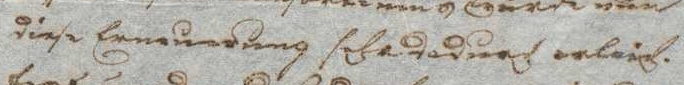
diese Erneuerung sehr dadurch erleich-
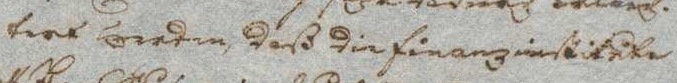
tert werden, daß die Finanzinstitute
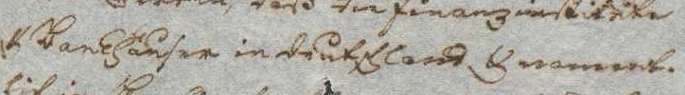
& Bankhäuser in Deutschland & nament-
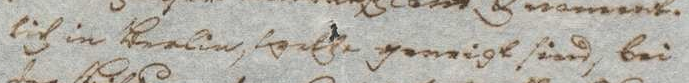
lich in Berlin, welche geneigt sind, bei
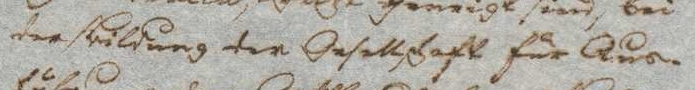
der Bildung der Gesellschaft für Aus-
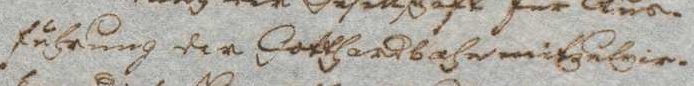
führung der Gotthardbahn mitzuwir-
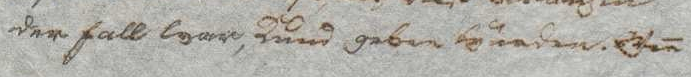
der Fall war, Kund geben würden. Wenn
